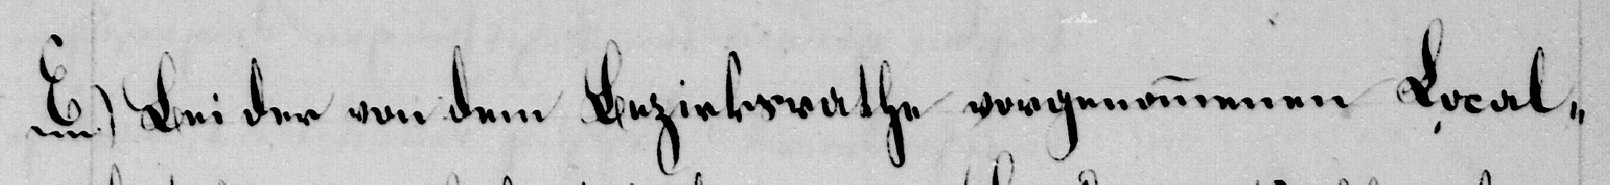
E.) Bei der von dem Bezirksrathe vorgenommenen Local¬
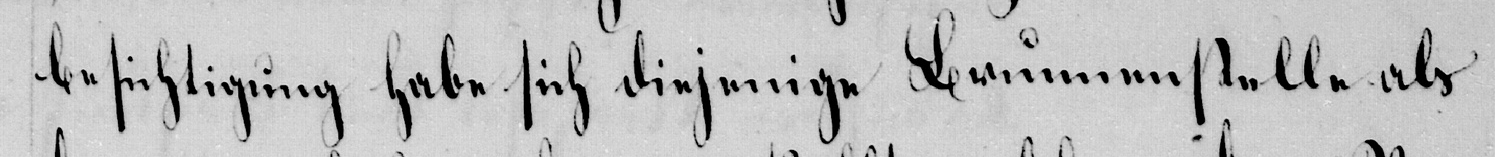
besichtigung habe sich diejenige Brunnenstelle als
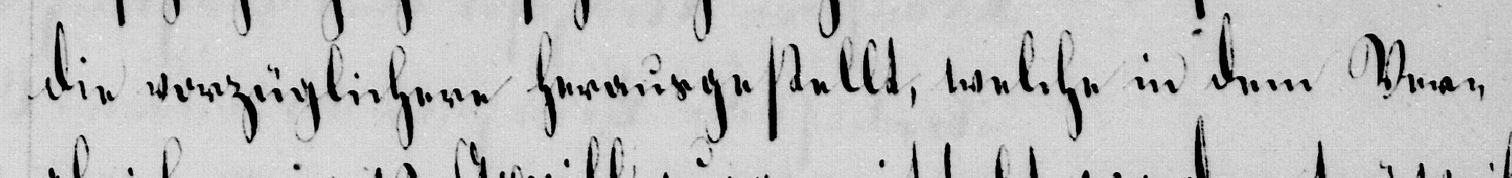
die vorzüglichere herausgestellt, welche in dem Ver¬
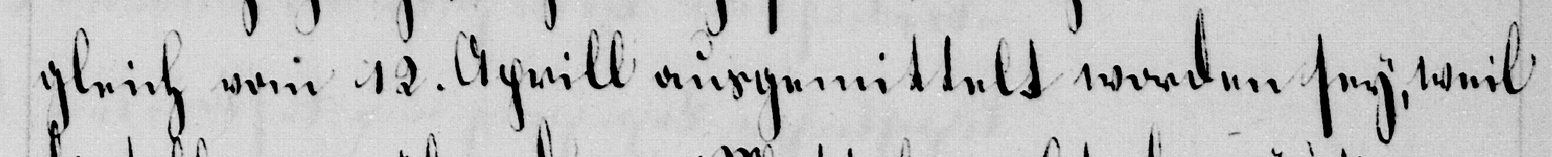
gleich vom 12. Aprill ausgemittelt worden sey, weil
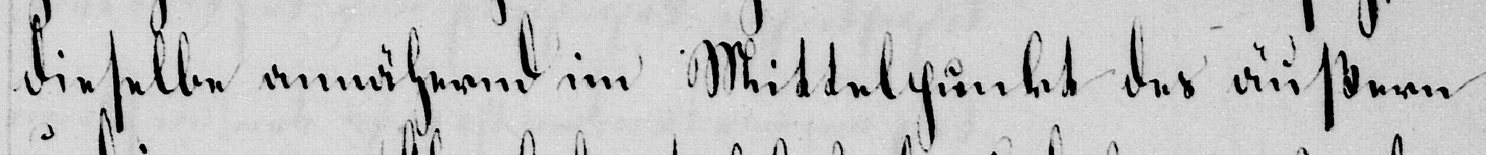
dieselbe annähernd im Mittelpunkt des äußern
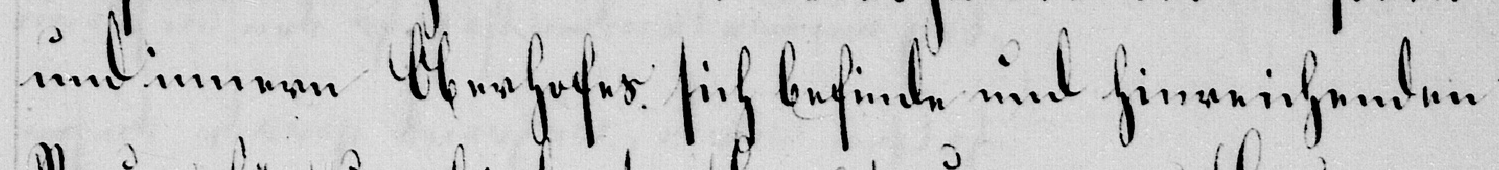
und innern Oberhofes sich befinde und hinreichenden
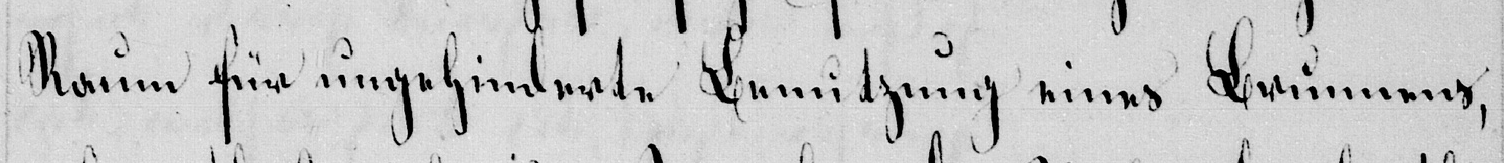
Raum für ungehinderte Benutzung eines Brunnens,
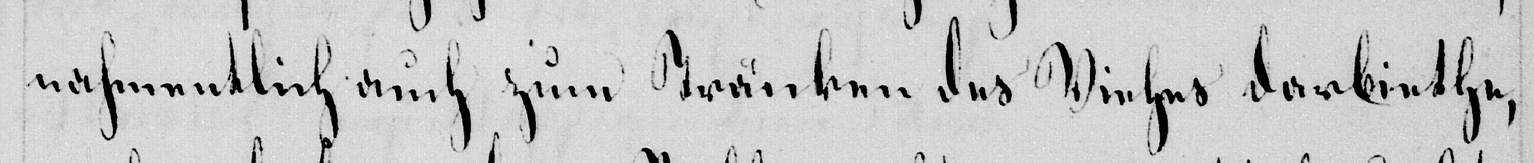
nahmentlich auch zum Tränken des Viehes darbiethe,
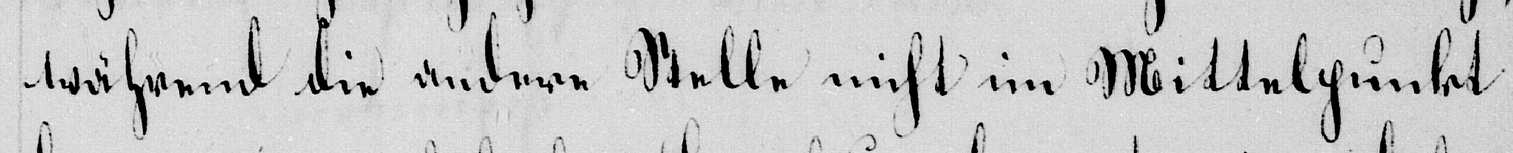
während die andere Stelle nicht im Mittelpunkt
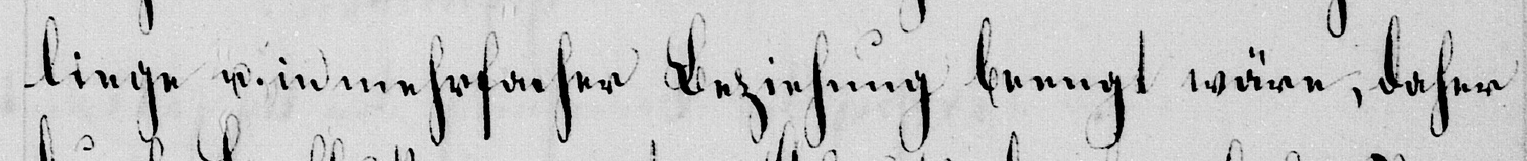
liege u. in mehrfacher Beziehung beengt wäre, daher
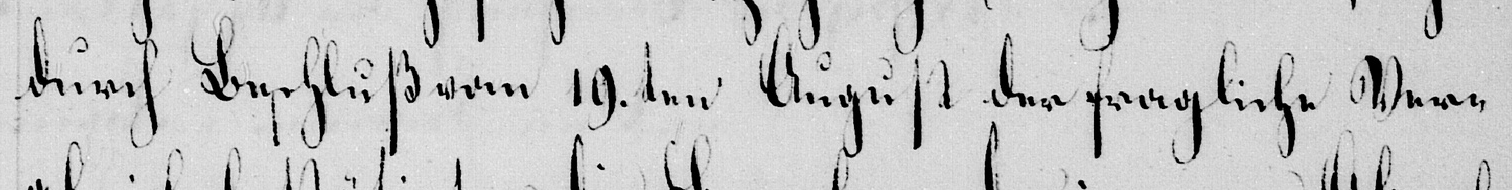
durch Beschluß vom 19.ten August der fragliche Ver¬
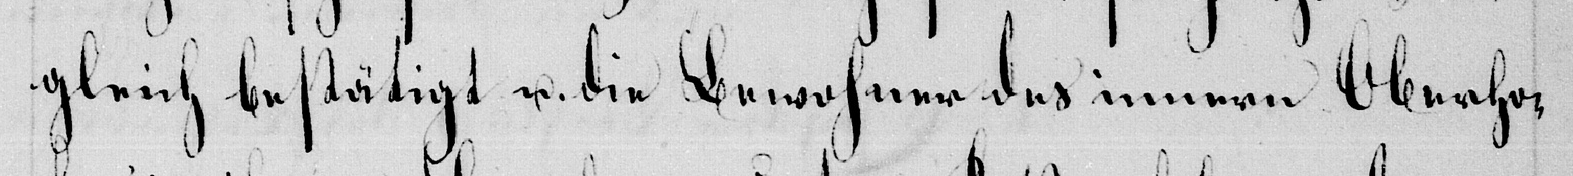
gleich bestätigt u. die Bewohner des innern Oberho¬
